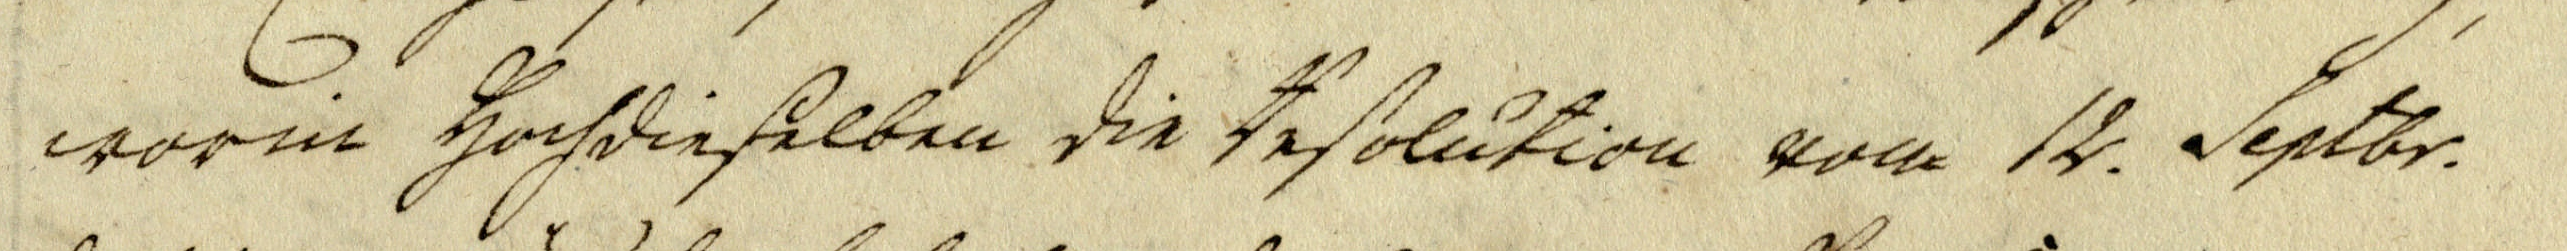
worin Hochdieselben die Resolution vom 12. Septbr.
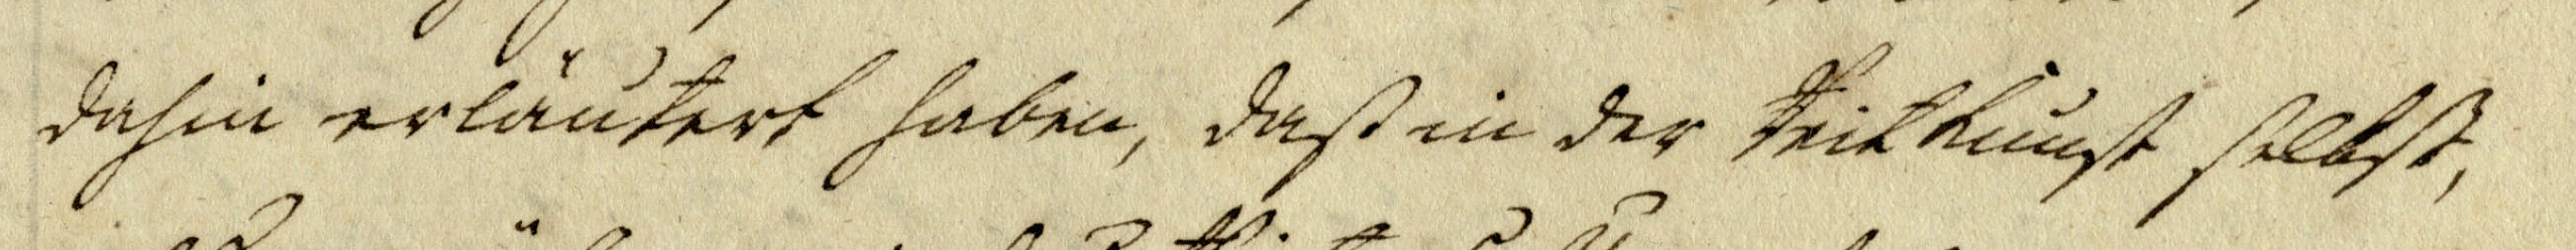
dahin erläutert haben, daß in der Reitkunst selbst,
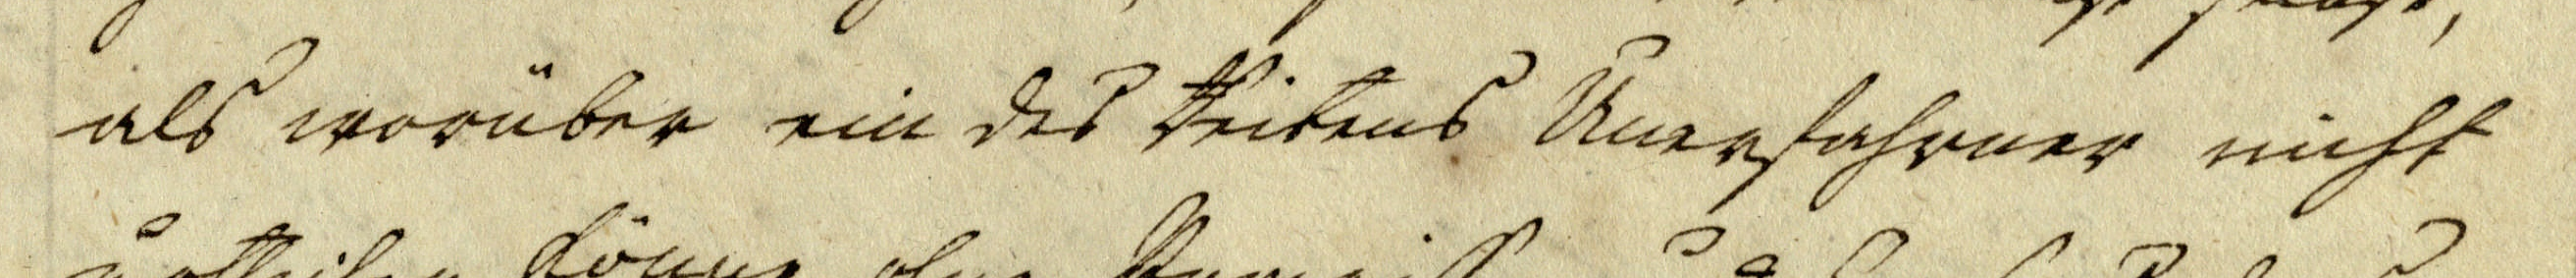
als worüber ein des Reitens Unerfahrner nicht
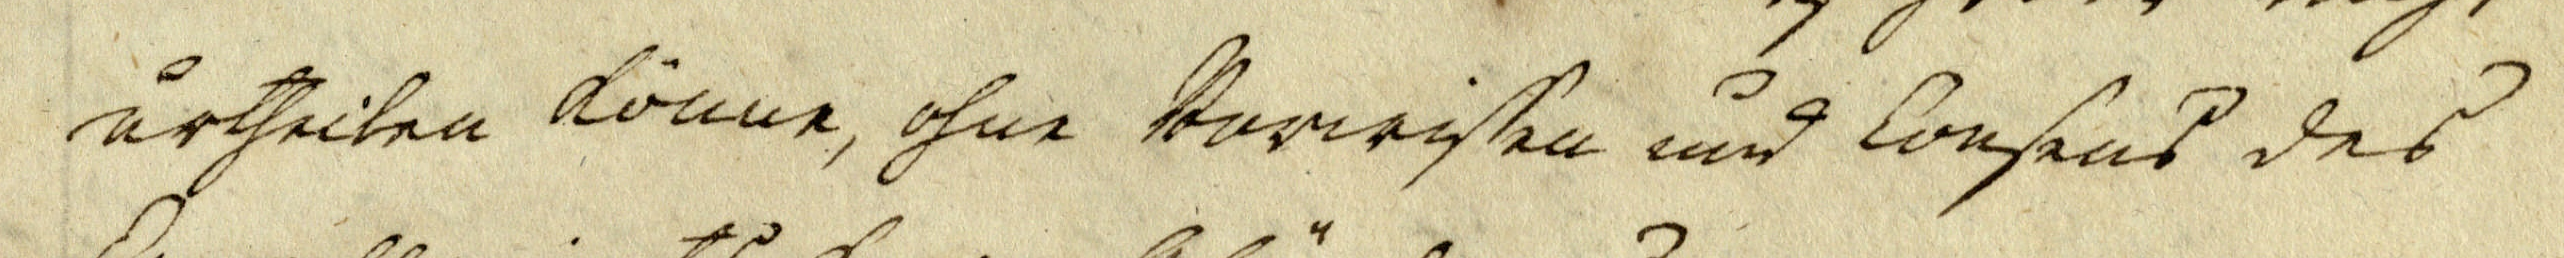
urtheilen könne, ohne Vorwissen und Consens des
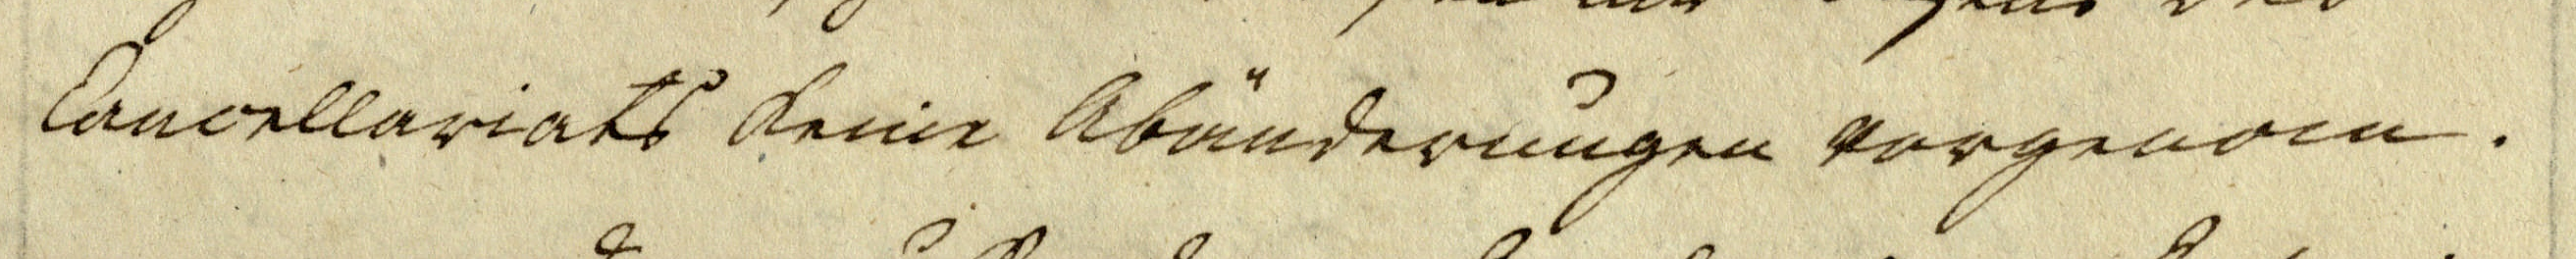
Cancellariats keine Abänderungen vorgenom¬
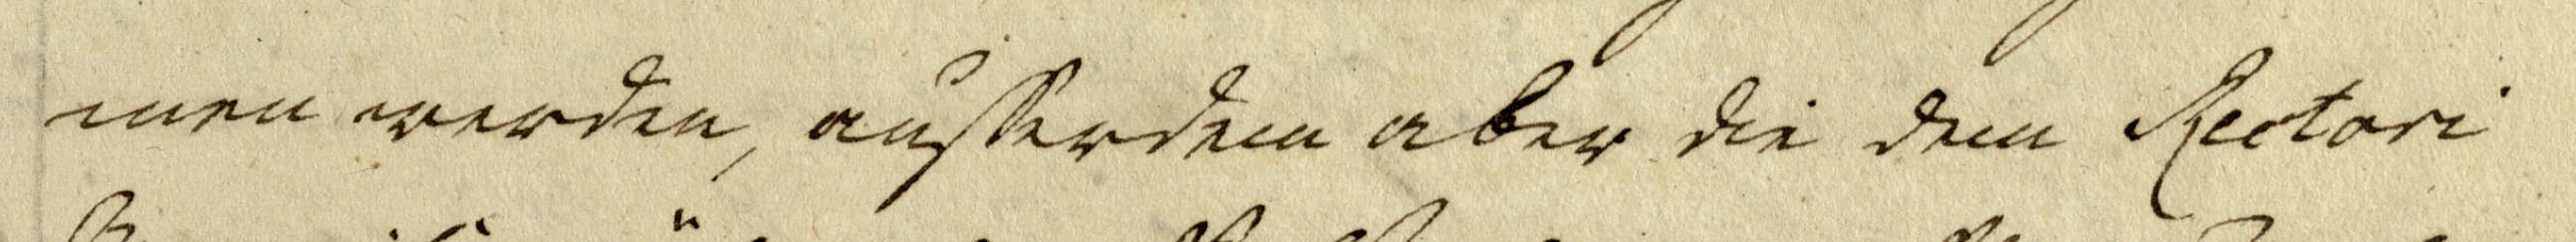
men werden, ausserdem aber die dem Rectori
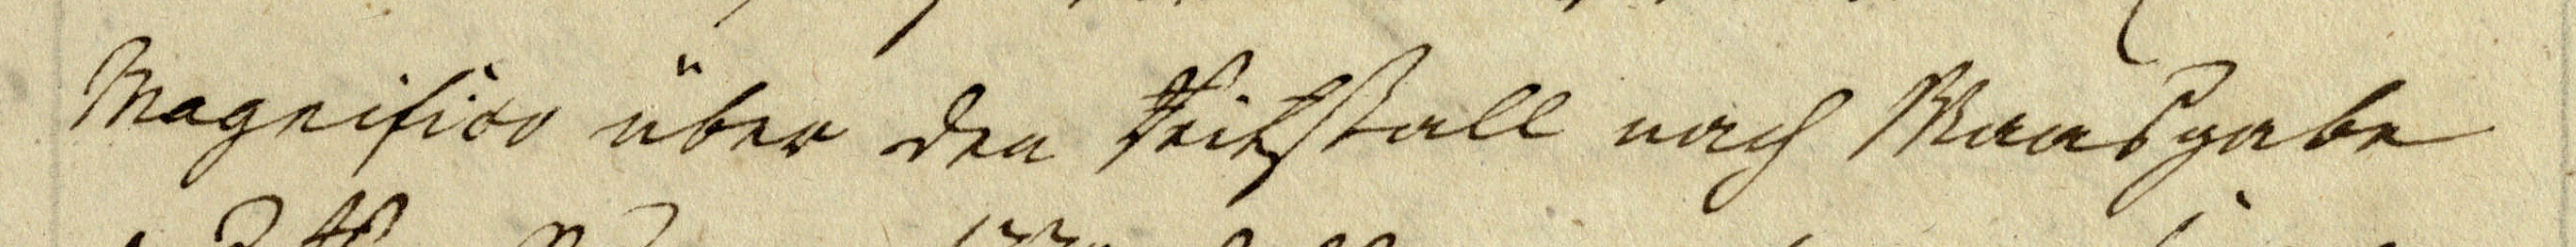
Magnifico über den Reitstall nach Maasgabe
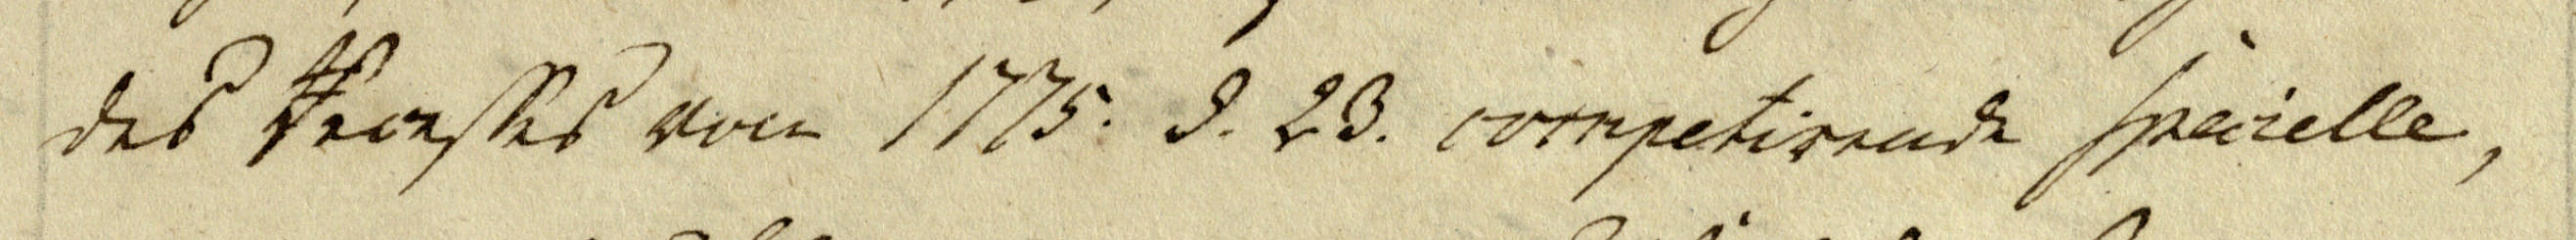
des Recesses von 1775. §. 23. competirende specielle,
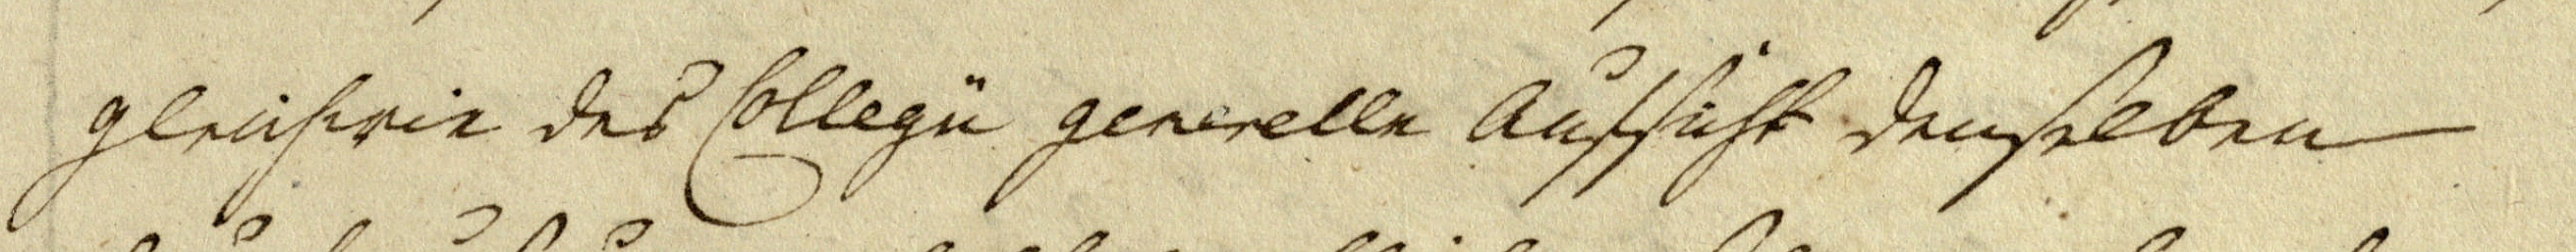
gleichwie des Collegii genenrelle Aufsicht denselben
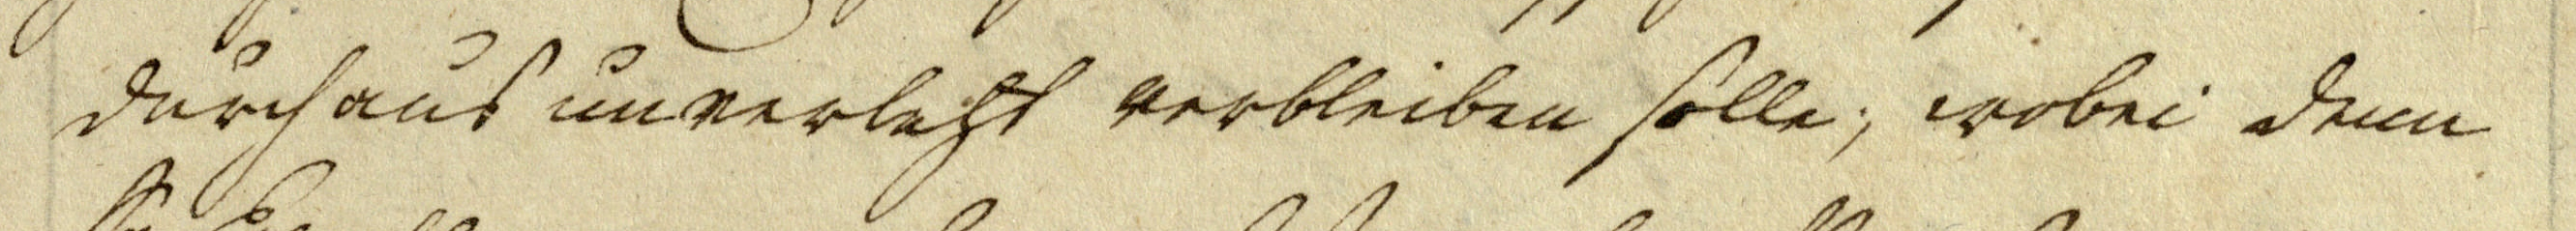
durchaus unverletzt verbleiben solle, wobei dem
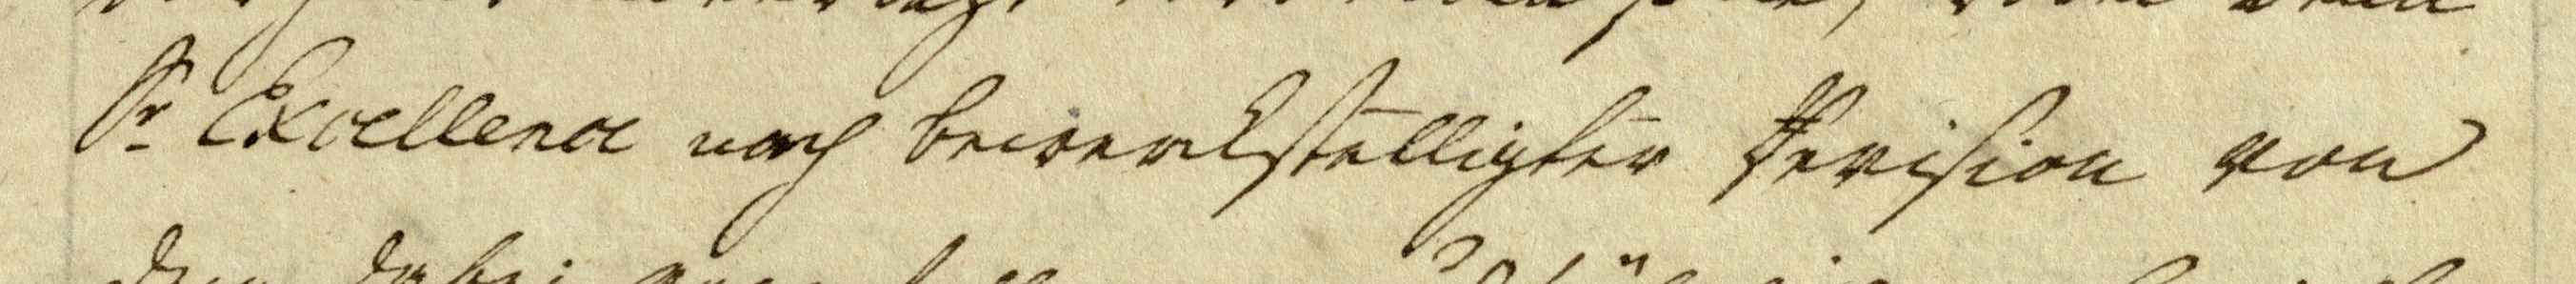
Sr Excellence nach bewerkstelligter Revision von
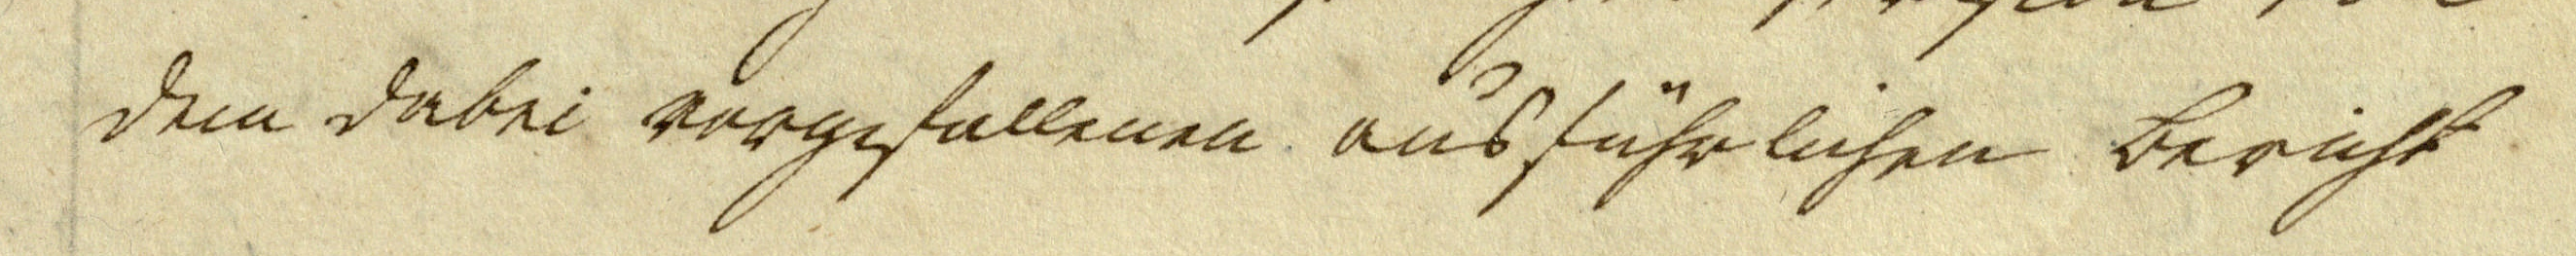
dem dabei vorgefallenen ausführlichen Bericht
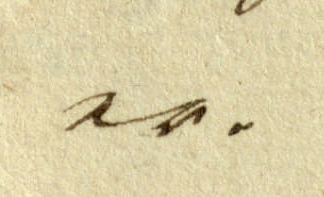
er¬
